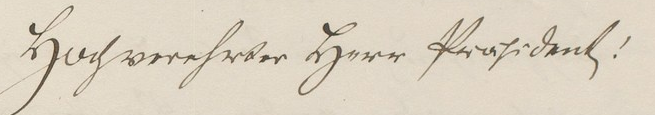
Hochverehrter Herr Präsident!
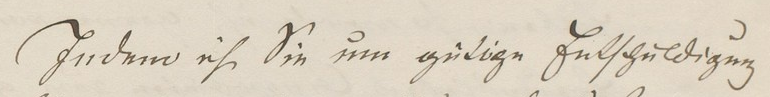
Indem ich Sie um gütige Entschuldigung
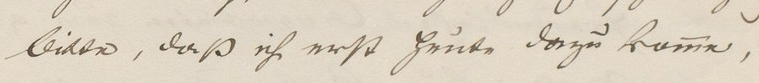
bitte, daß ich erst heute dazu komme,
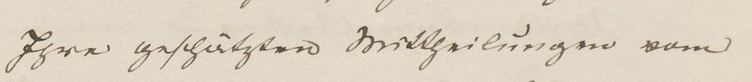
Ihre geschätzten Mittheilungen vom
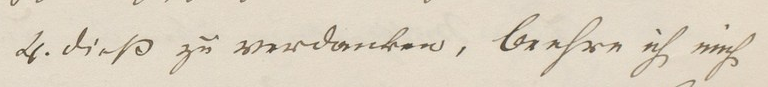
4. dieß zu verdanken, beehre ich mich
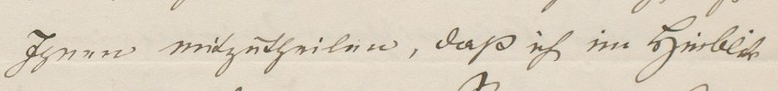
Ihnen mitzutheilen, daß ich im Hinblik
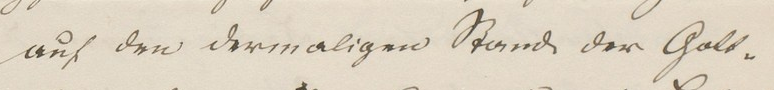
auf den dermaligen Stand der Gott-
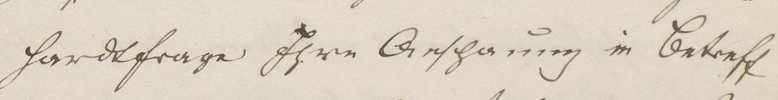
hardtfrage Ihre Anschauung in Betreff
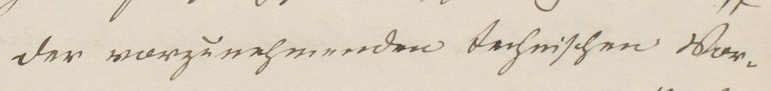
der vorzunehmenden technischen Vor-
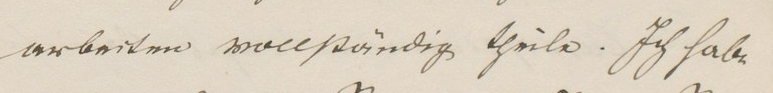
arbeiten vollständig theile. Ich habe
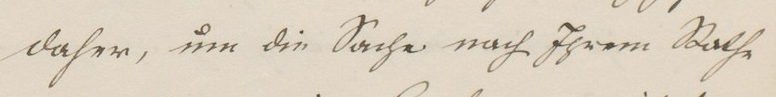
daher, um die Sache nach Ihrem Rathe
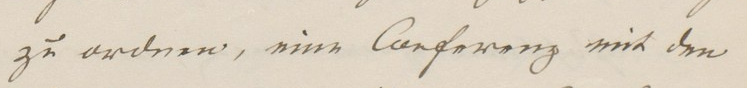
zu ordnen, eine Conferenz mit den
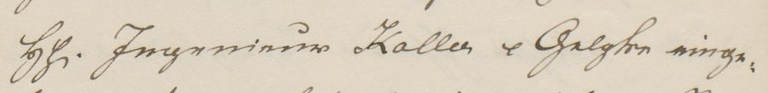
HH. Ingenieur Koller & Gelpke einge-
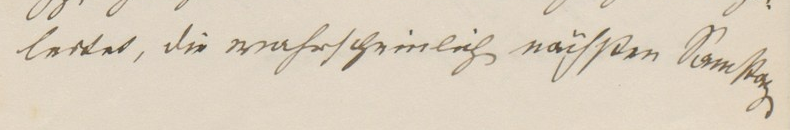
leitet, die wahrscheinlich nächsten Samstage
